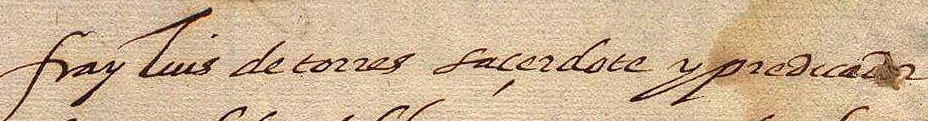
fray Luis de torres sacerdote y predicador
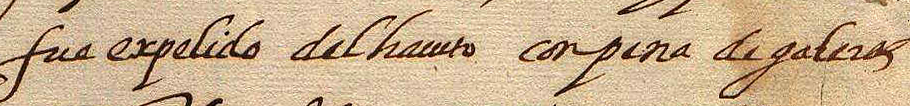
fue expelido del hauito con pena de galeras
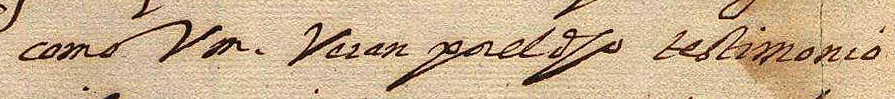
como Vm. Veran por el dho testimonio
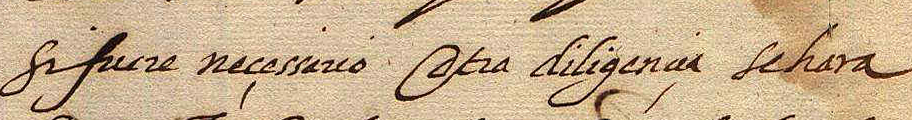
si fuere necessario otra diligencia se hara
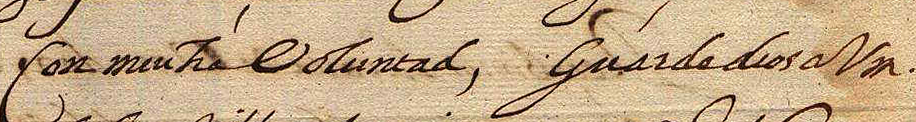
Con mucha Voluntad, Guarde dios a Vm.
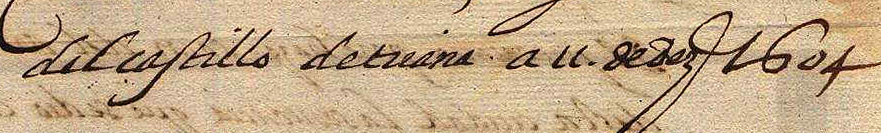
del castillo de triana a 11. de Dez̄ 1604
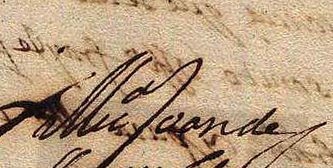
el licdo Juan de
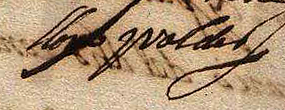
llano y valdes
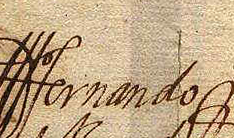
Hernando
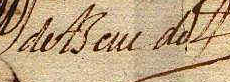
de Azeuedo
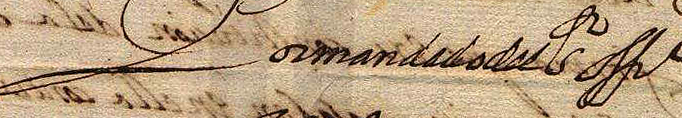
Por mandado del sto offio
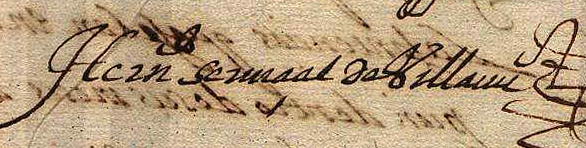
Hern.do seueraal de VillauicSa
